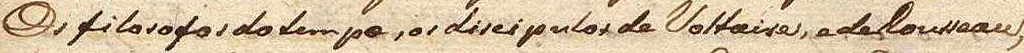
Os filosofos do tempo, os discipulos de Voltaire, e de Rousseau,
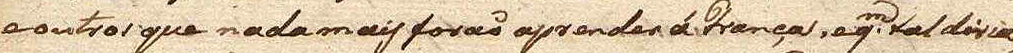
e outros que nada mais foraõ aprender á França, e q.m tal diria,
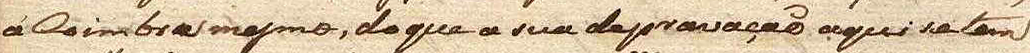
á Coimbra mesmo, do que a sua depravaçaõ aqui se tem
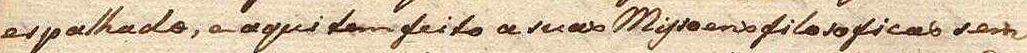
espalhado, e aqui tem feito a suas Missoens filosoficas sem
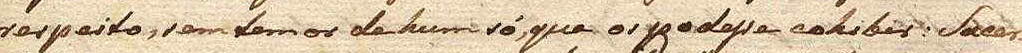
respeito, sem temor de hum só, que os podesse cohibir: Sacer
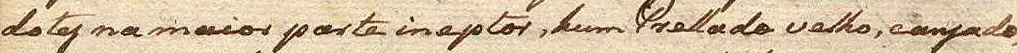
dotes na maior parte ineptos, hum Prellado velho, cansado,
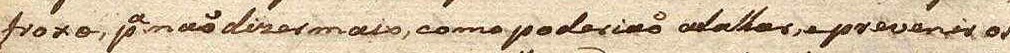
froxo, p.a naõ dizer mais, como poderiaõ atalhar, e prevenir os
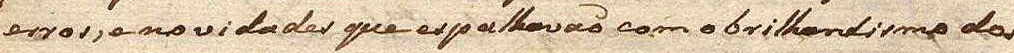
erros, e novidades que espalhavaõ com o brilhantismo dos
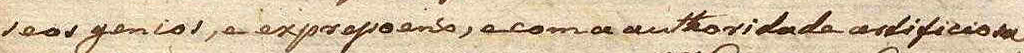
seos genios, e expressoens, e com a authoridade artificiosa
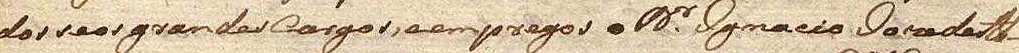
dos seos grandes Cargos, e empregos o D.or Ignacio Ioze de Al
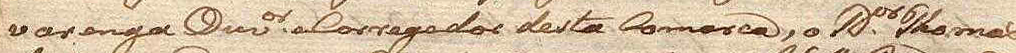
varenga Ouv.or e Corregedor desta Comarca, o D.or Thomas
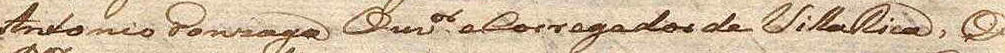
Antonio Gonzaga Ouv.or e Corregedor de Villa Rica, O
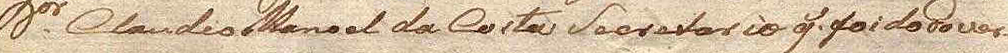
D.or Claudio Manoel da Costa Secretario q̄. foi do Gover
